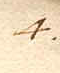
4.
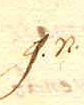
g. n.
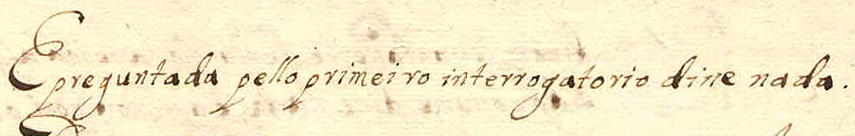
E preguntada pello primeiro interrogatorio disse nada.
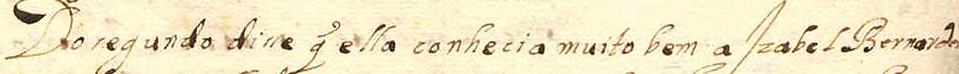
Do segundo disse q̄ ella conhecia muito bem a Jzabel Bernarda
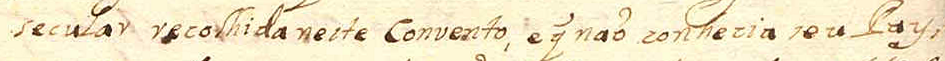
secular recolhida neste convento, e q̄ naõ conhecia seu Pay, e
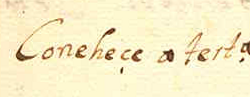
Conehece a test.a
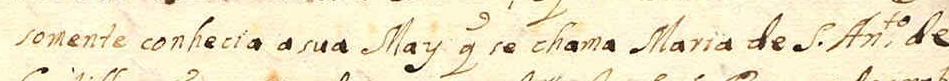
somente conhecia a sua May q̄ se chama Maria de S. An.to de
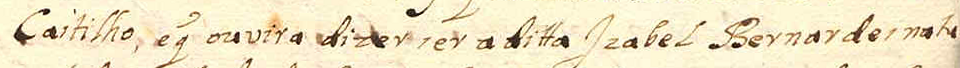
Castilho, e q̄ ouvira dizer ser a ditta Jzabel Bernardes natu
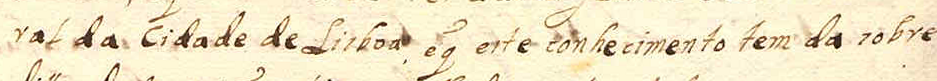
ral da Cidade de Lisboa, e q̄ este conhecimento tem da sobre
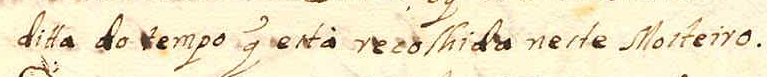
ditta do tempo q̄ esta recolhida neste Mosteiro.
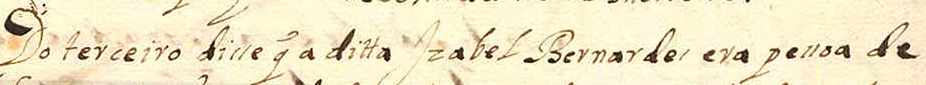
Do terceiro disse q̄ a ditta Izabel Bernardes era pessoa de
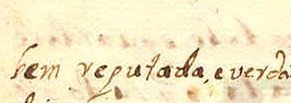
bem reputada, e verda
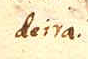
deira.
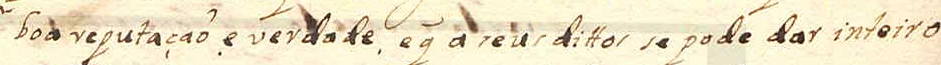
boa reputaçaõ, e verdade, e q̄ a seus dittos se pode dar inteiro
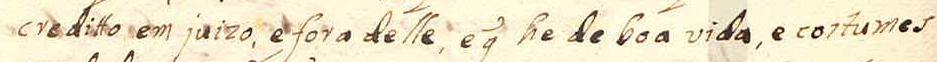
creditto em juizo, e fora delle, e q̄ he de boa vida, e costumes
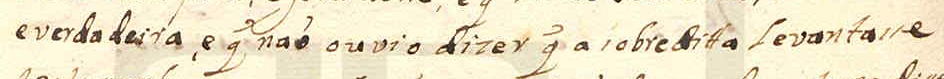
e verdadeira, e q̄ naõ ouvio dizer q̄ a sobredita levantasse
